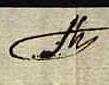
J̄hs
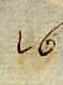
16
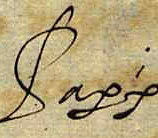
Pax xi
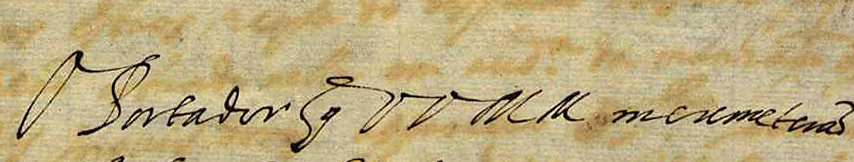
O Portador q̄ VV MM me remeteraõ
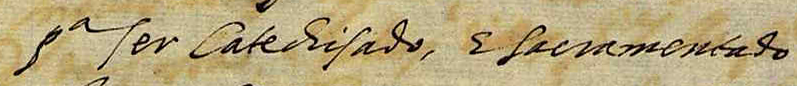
pa ser Catechisado, E sacramentado
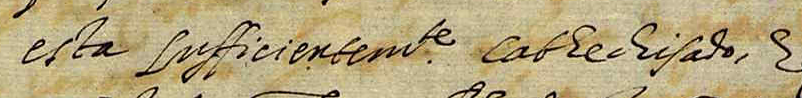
esta sufficientem.te cathechisado, E
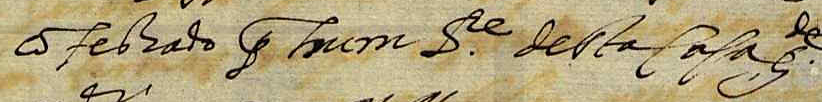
cōfessado p̄ hum P.e desta Casa, g.de
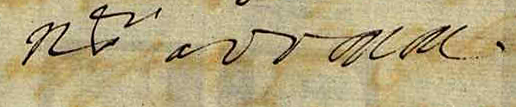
N sor a VV MM.
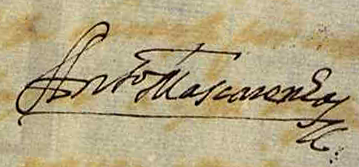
Anto Mascarenhas
